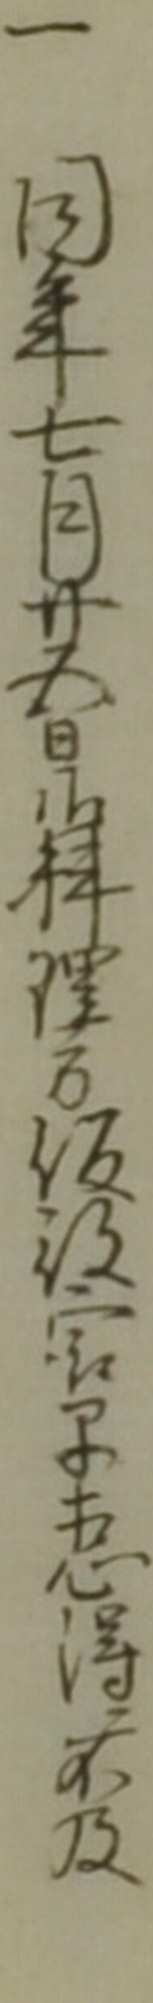一同年七月廿五日御料理方仮役最早相心得ニ不及
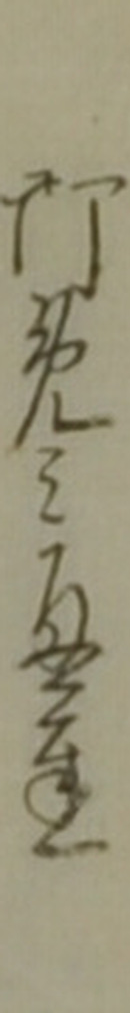御免之通達
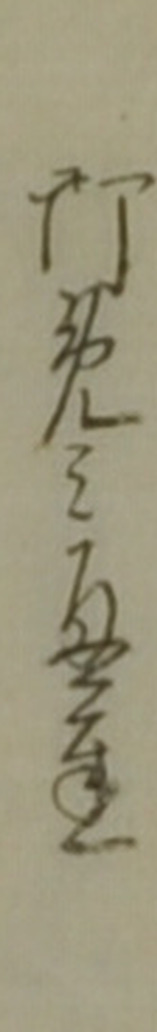御免之通達
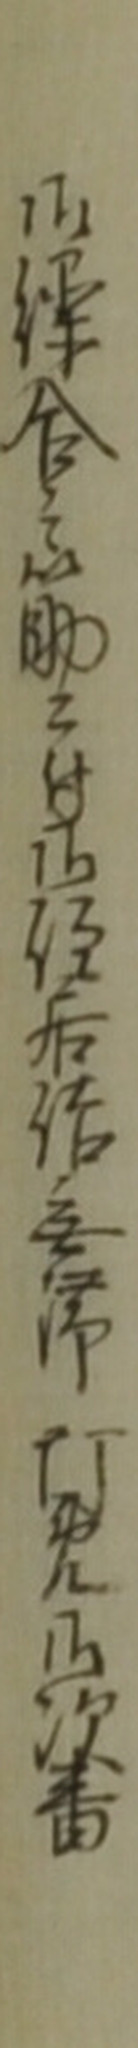御繰合之筋ニ付御住居詰無滞御免御次番
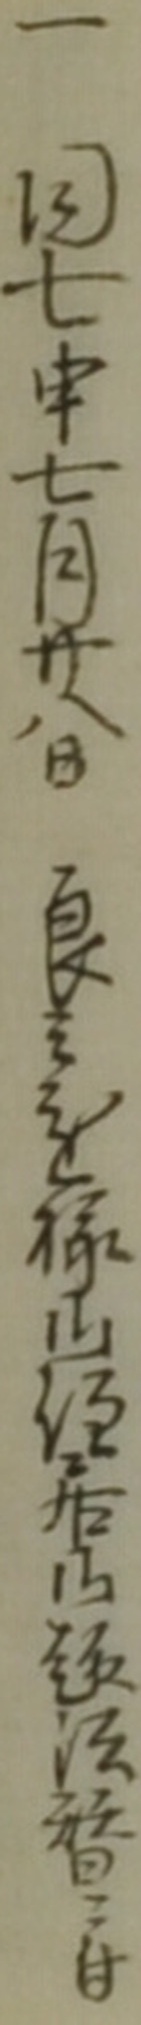一同七申七月廿八日良之進様御住居御趣法替ニ付
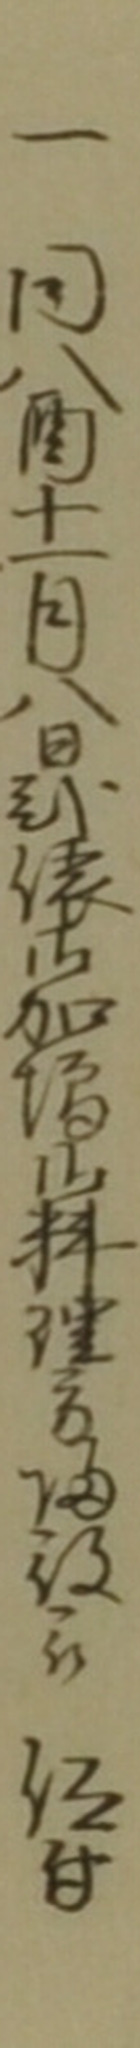一同八酉十一月八日弐俵御加増御料理方帰役被仰付
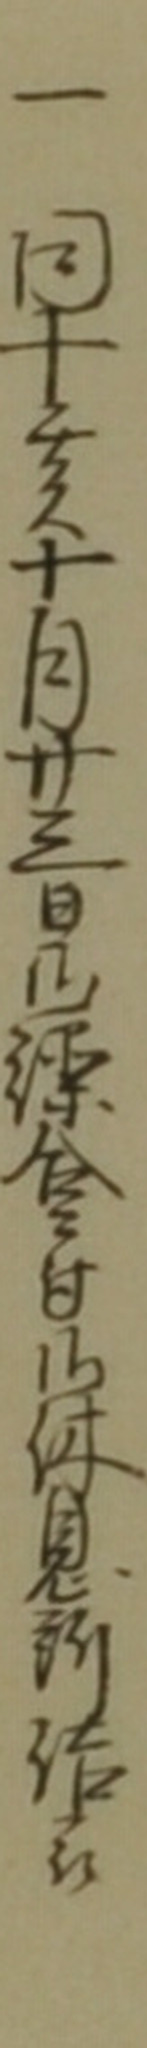一同十亥十月廿三日御繰合ニ付御休息所詰被
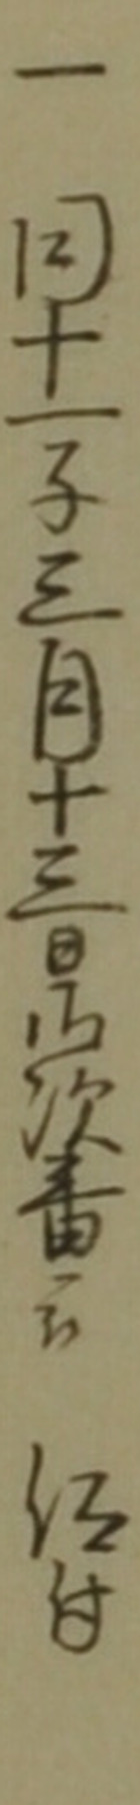一同十一子三月十三日御次番被仰付
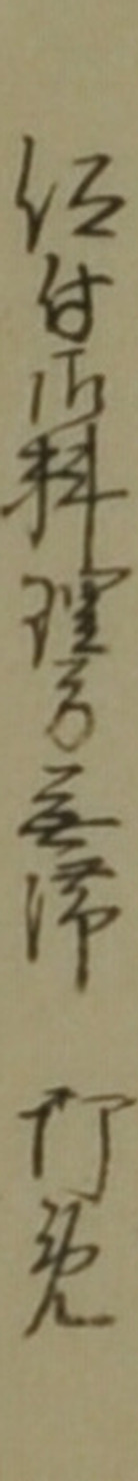仰付御料理方無滞御免
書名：無足諸士勤仕録（五）
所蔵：伊那市立高遠町図書館・合同会社AMANE
